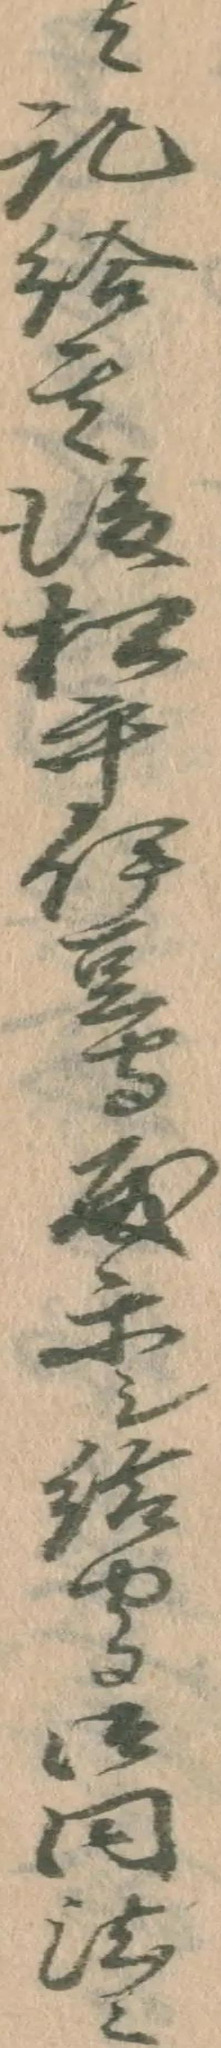与記給其後松平伊豆守殿示し給ゆる御同法に
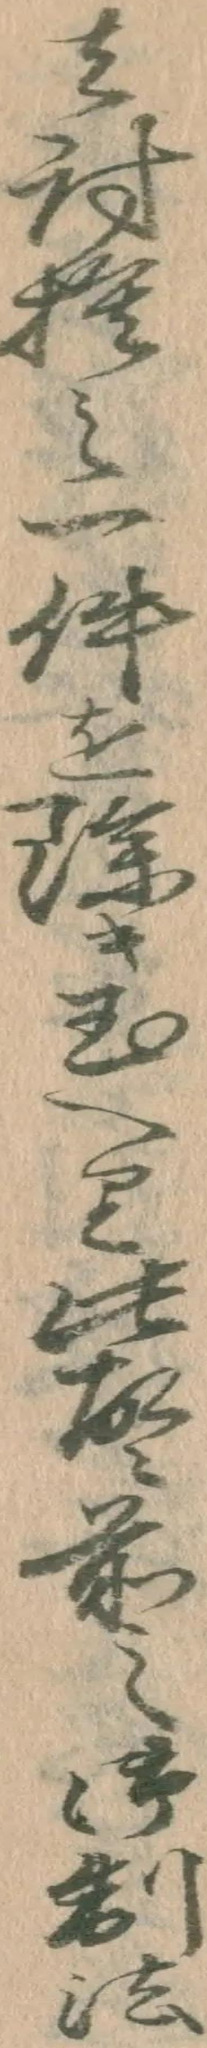者討捨之一件を除き至へ里此故に前之御制法
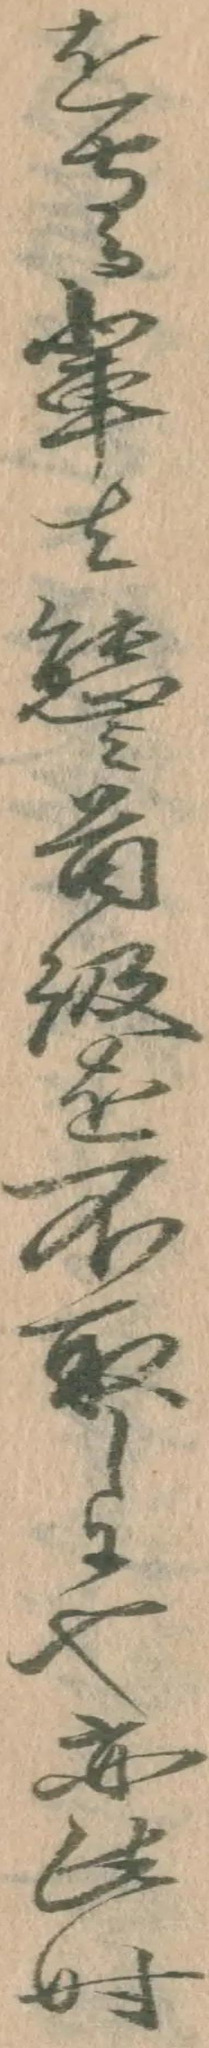を守而輩者態与首級を不取し尓也亦此時
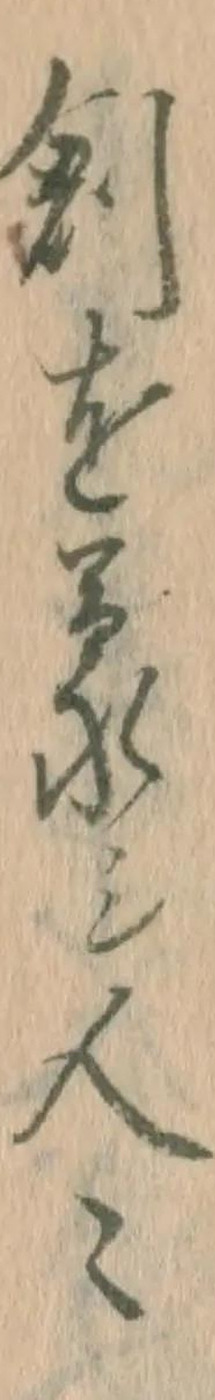創を承し人々
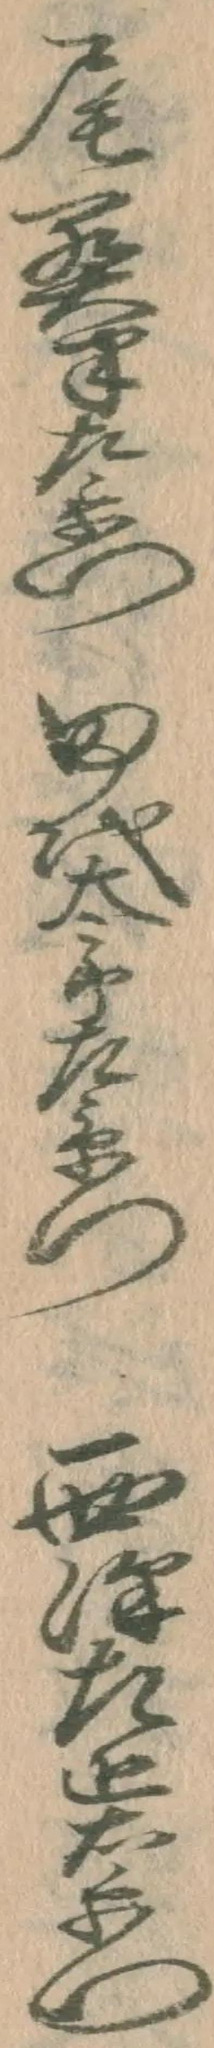尾関半左衛門田代太郎左衛門西沢左近右衛門
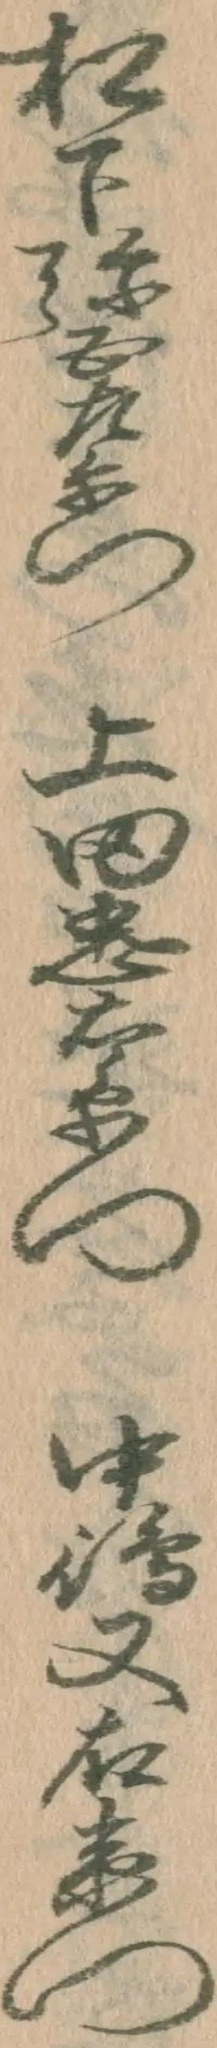松下弥五左衛門上田忠右衛門中島又右衛門
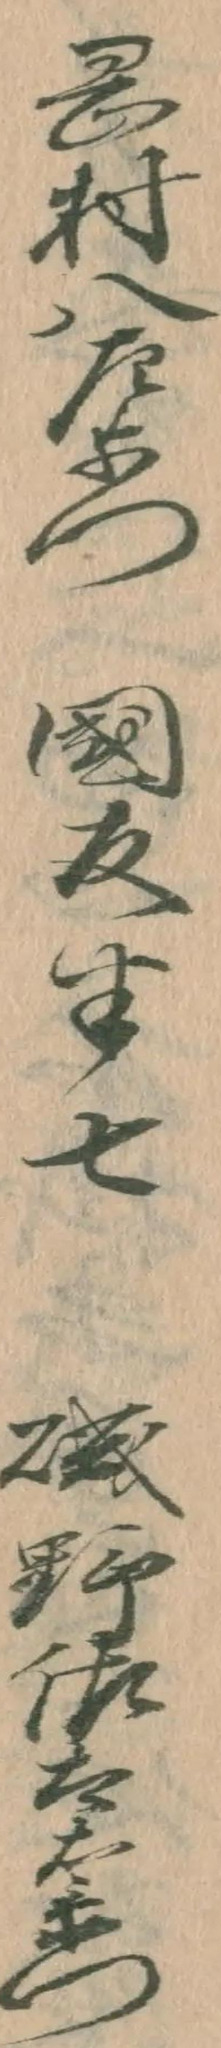岡村八左衛門国友半七磯野佐太右衛門
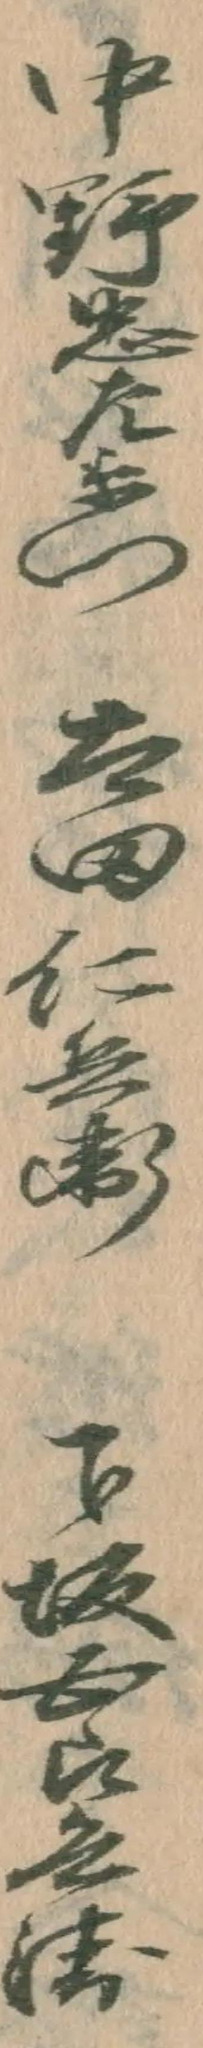中野忠左衛門太田仁兵衛下坂五郎兵衛
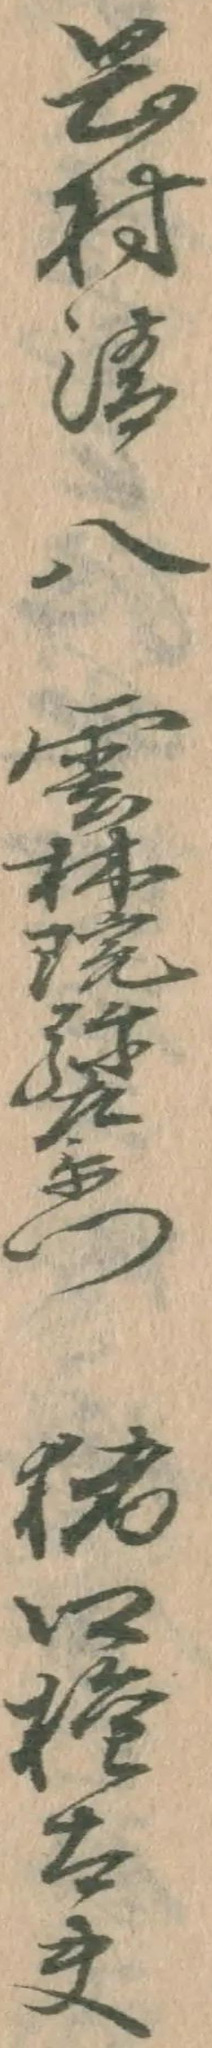岡村清八雲林院弥左衛門猪口権太夫
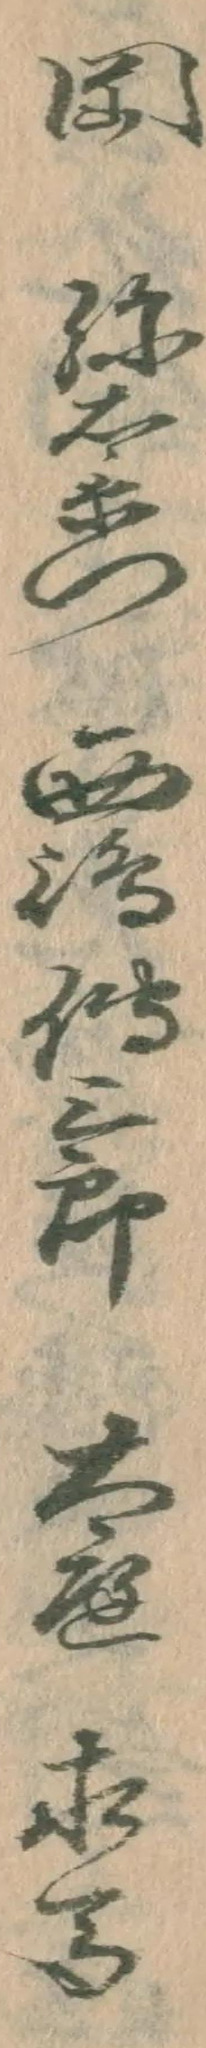岡弥右衛門西島伝三郎大庭求馬
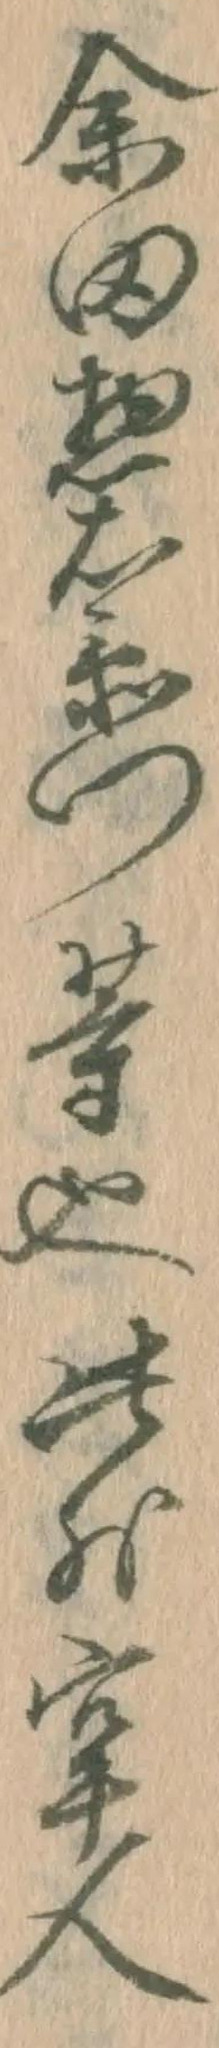余田惣右衛門等也此外牢人
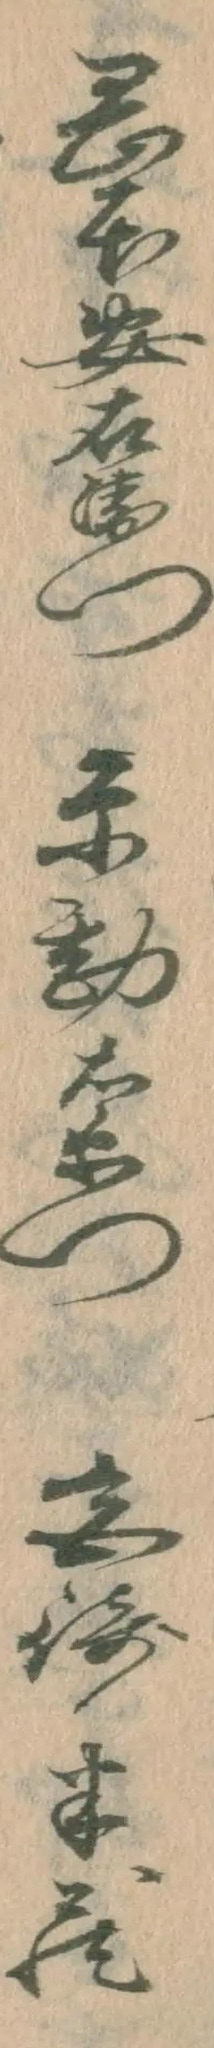岡本安右衛門原勘右衛門宮崎半蔵
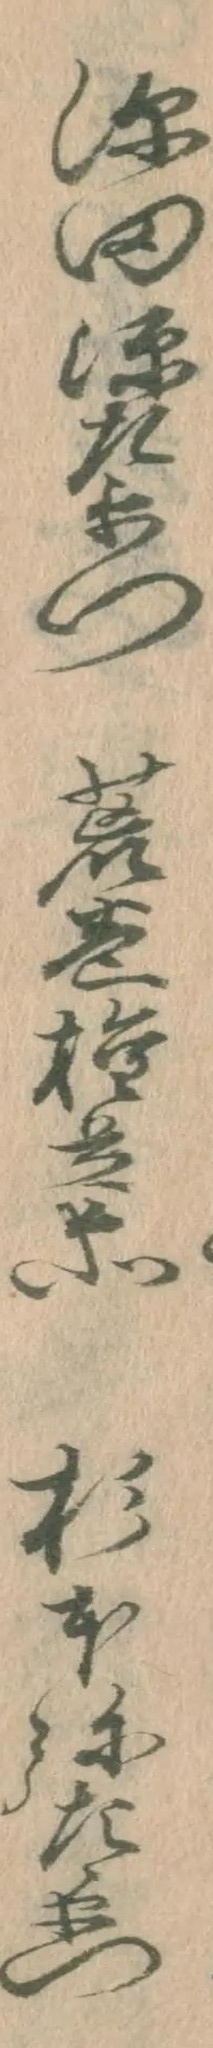深田源左衛門荒巻権兵衛杉本弥左衛門
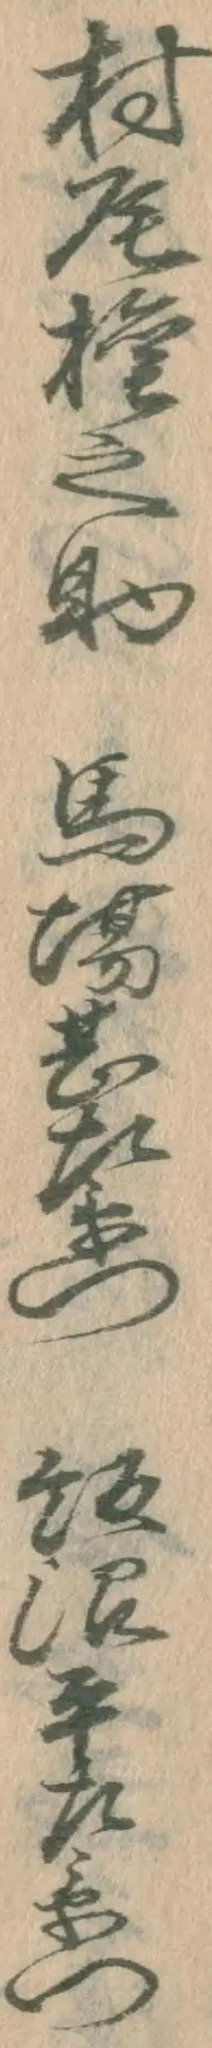村尾権之助馬場甚左衛門飯沼平左衛門
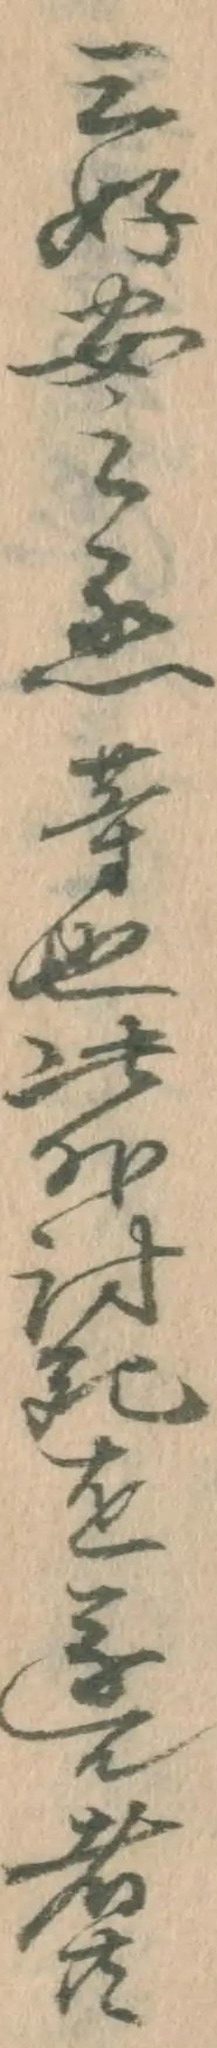三好安之丞等也此外討死を遂る者共
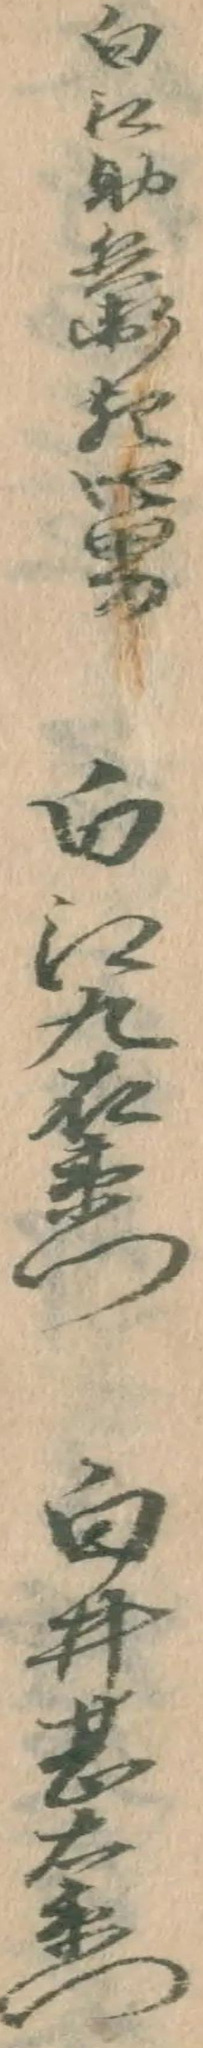白江助兵衛歟四男白江九左衛門白井甚右衛門
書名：切支丹御退治記 49巻. [8]
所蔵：国立国会図書館 National Diet Library, JAPAN
